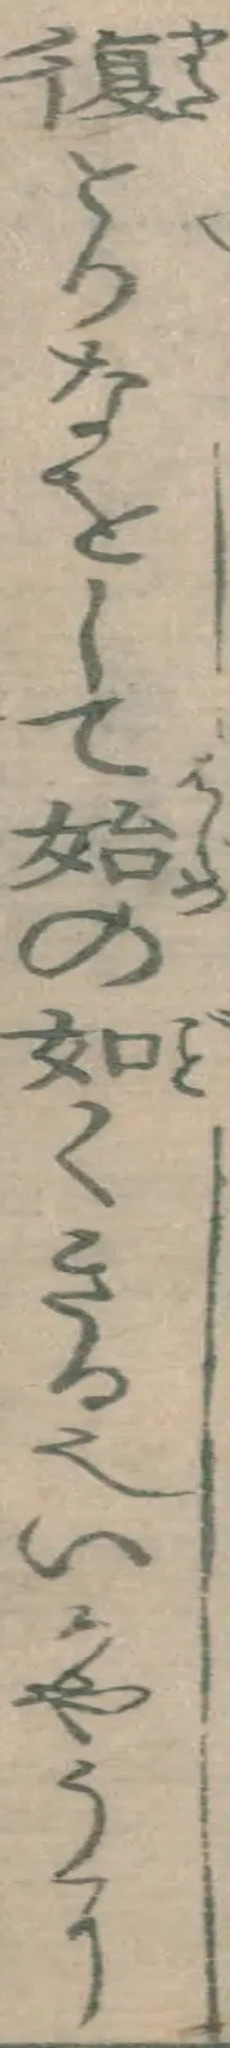復とりなをして始の如くきる也いかやうに

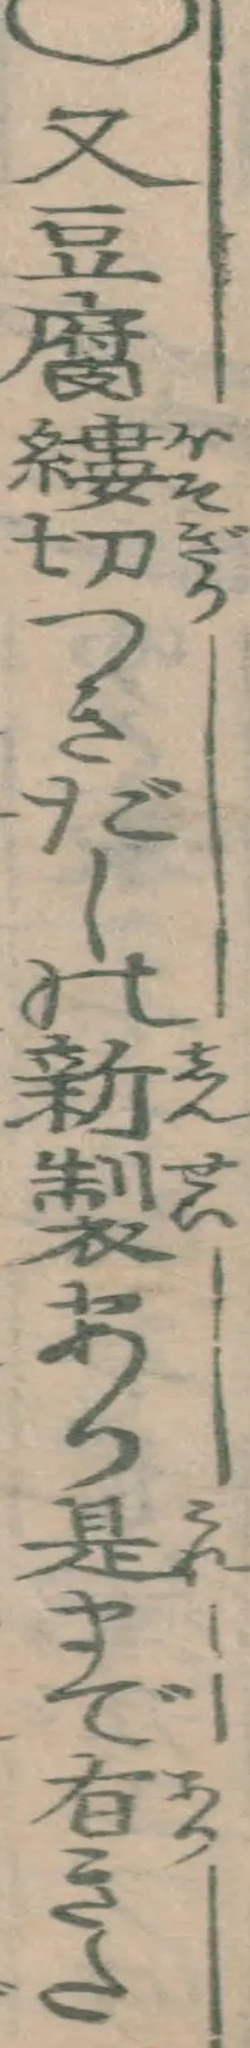○又豆腐縷切つきだしの新製あり是まで有きた
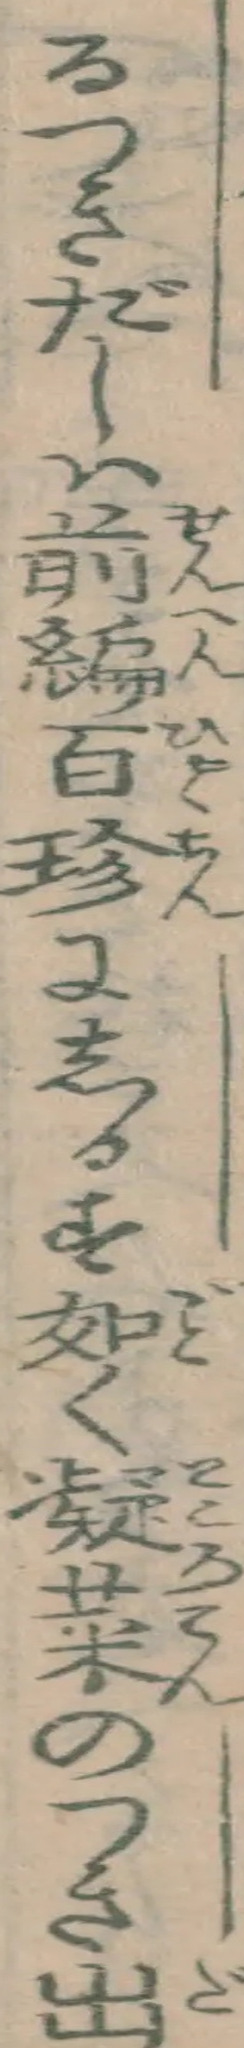るつきだしは前編百珍にしるす如く凝菜のつき出
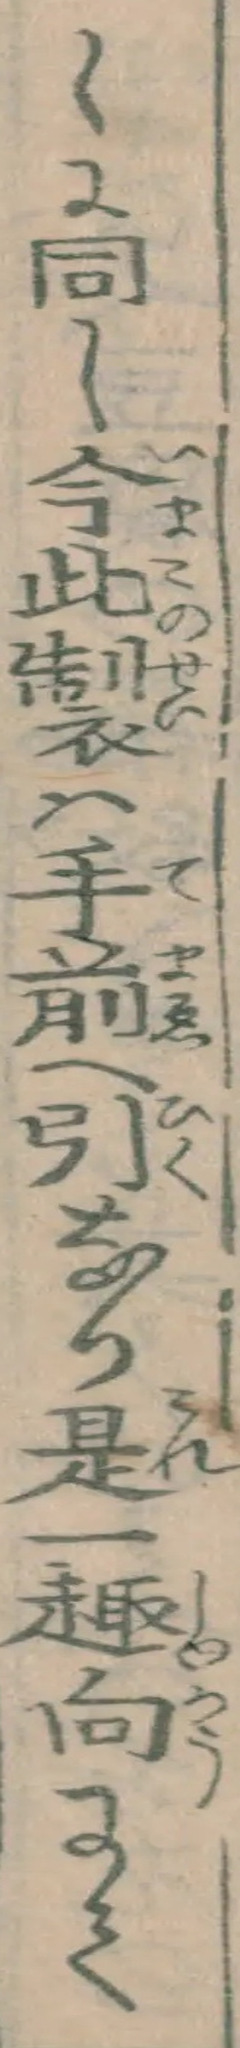しに同し今此製は手前へ引なり是一趣向にて
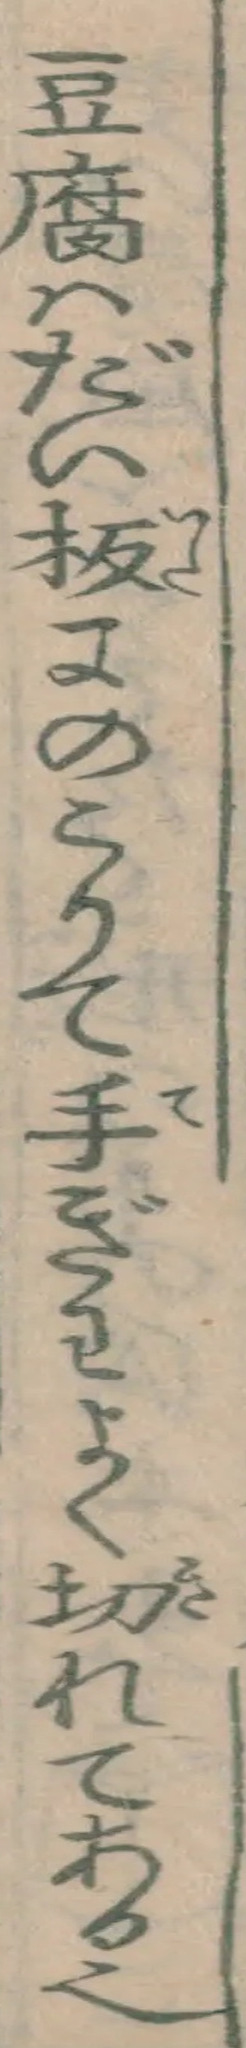豆腐はだい板にのこりて手ぎわよく切れてある也
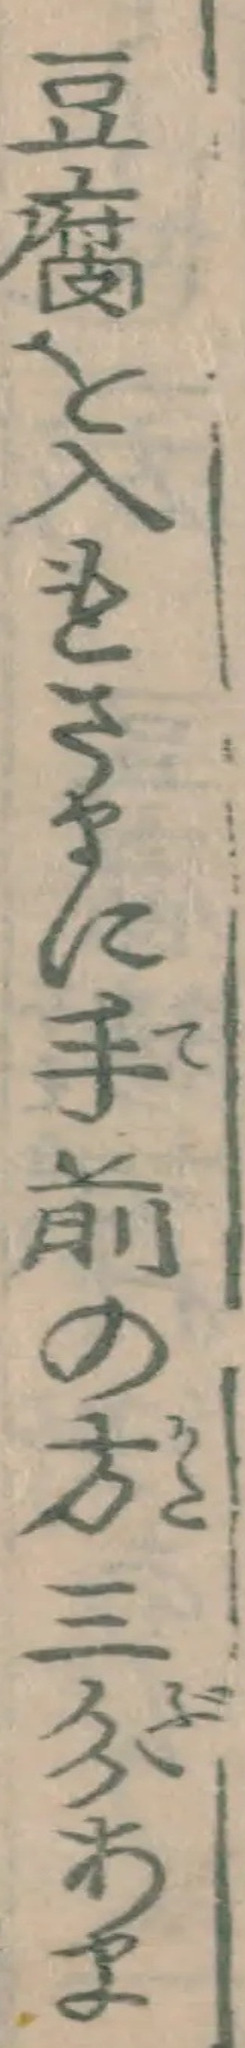豆腐を入れさまに手前の方三分あま
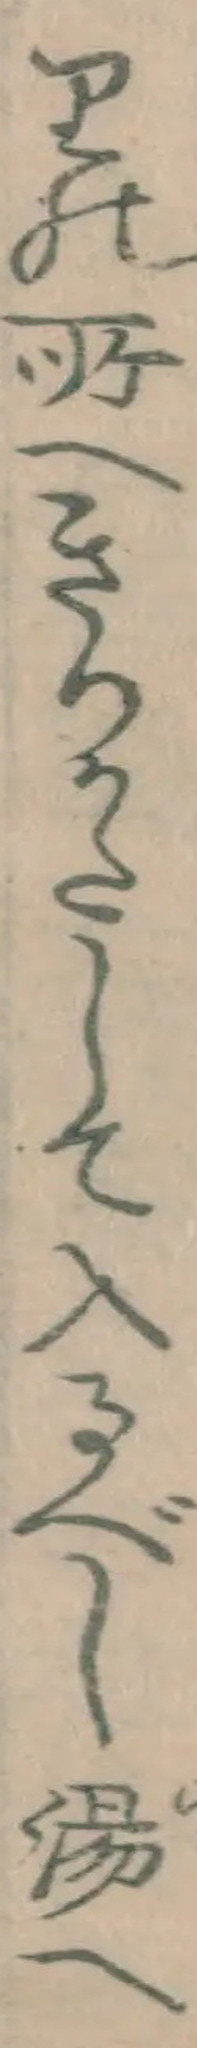りの所へきりかたして入るべし湯へ
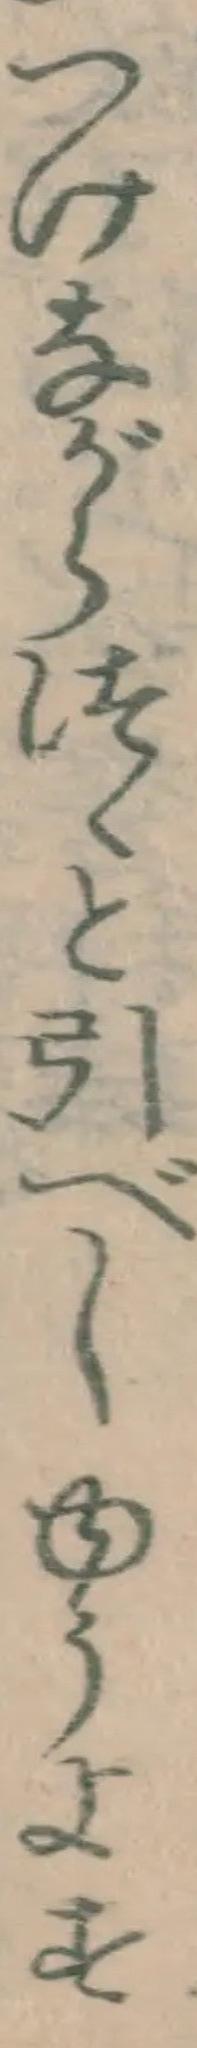つけながらつゝと引べしゆうよす
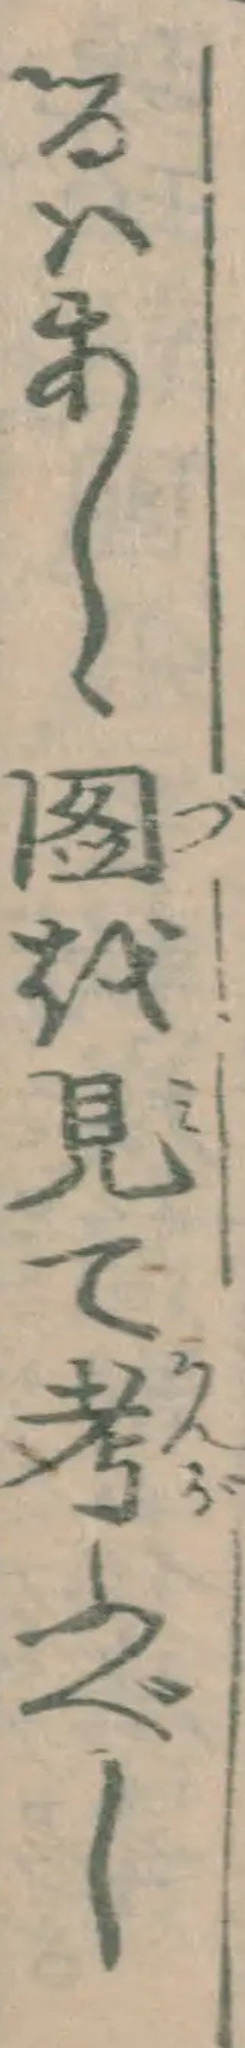るはあしゝ図を見て考ふべし
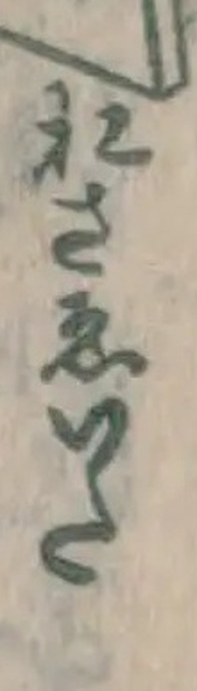おさゑいた
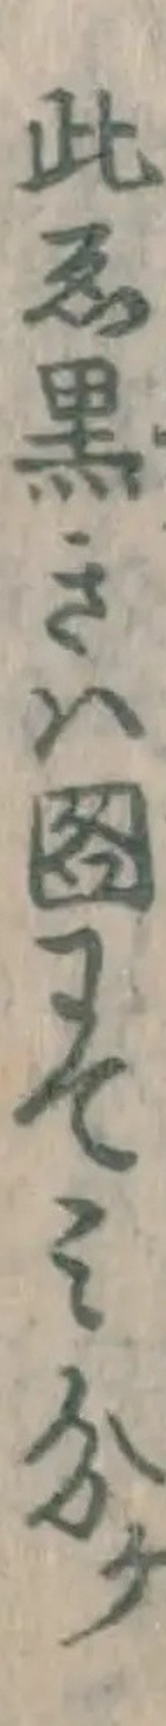此ゑ黒きは図にてみ分け
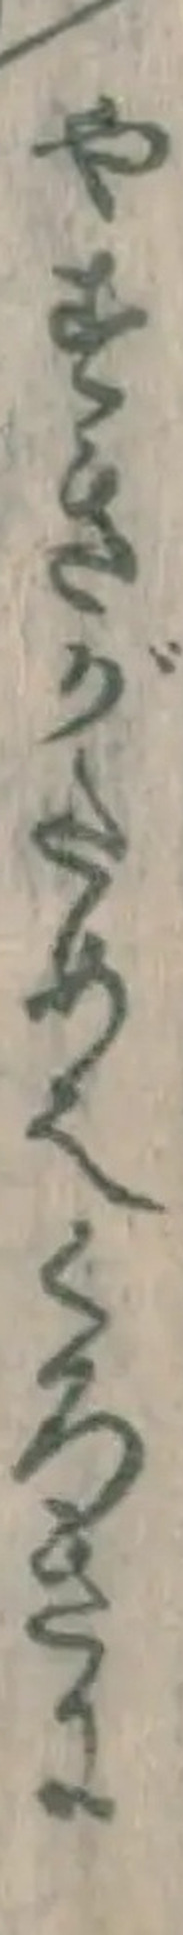やすきがため也くろきに
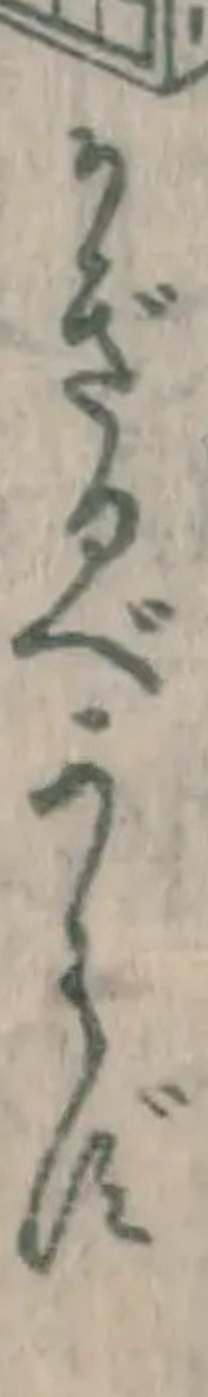かぎるべからず
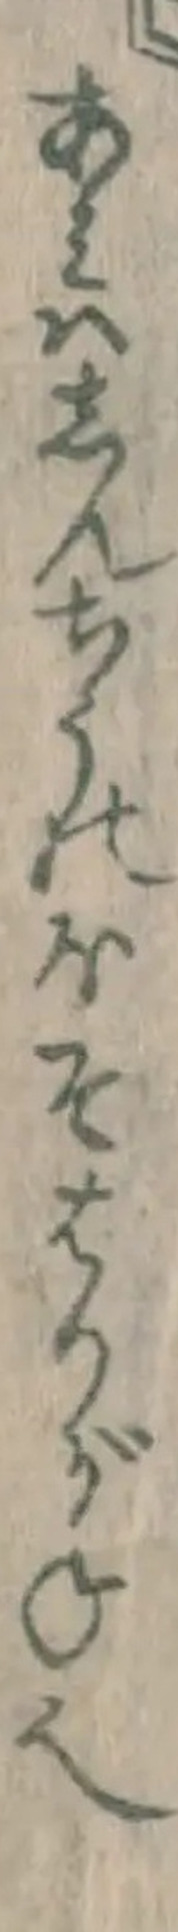あみはしんちうのほそはりがね也

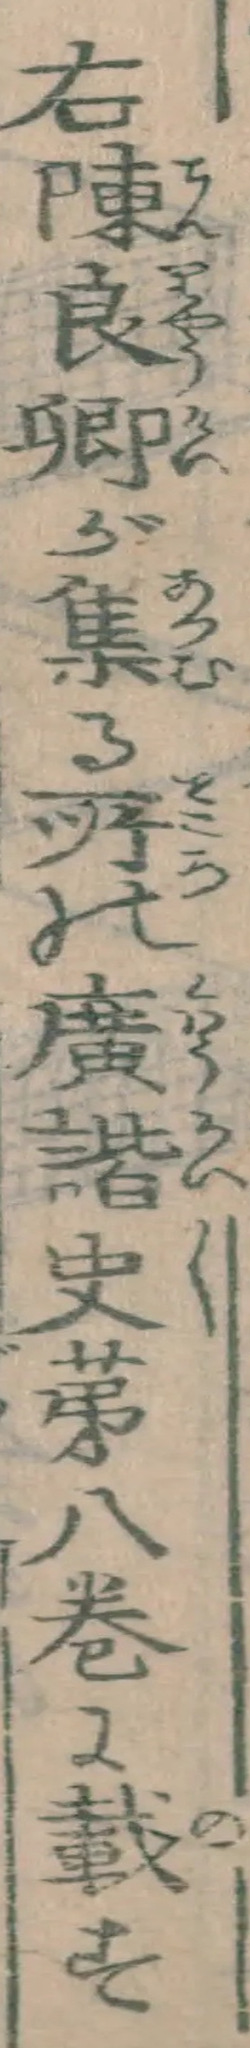右陳良卿が集る所の広諧史第八巻に載す
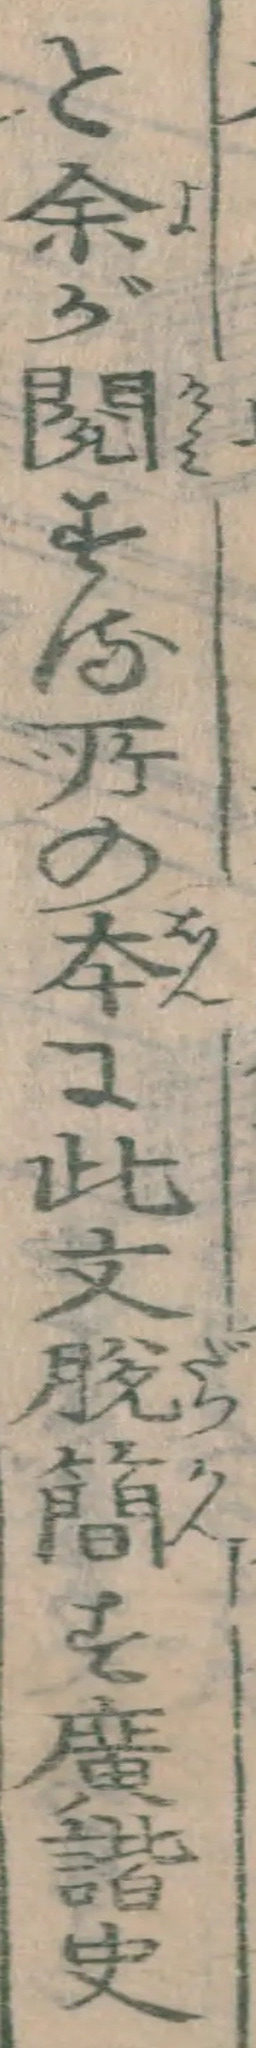と余が閲する所の本に此文脱簡す広諧史
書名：豆腐百珍. 続編
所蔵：国立国会図書館 National Diet Library, JAPAN
